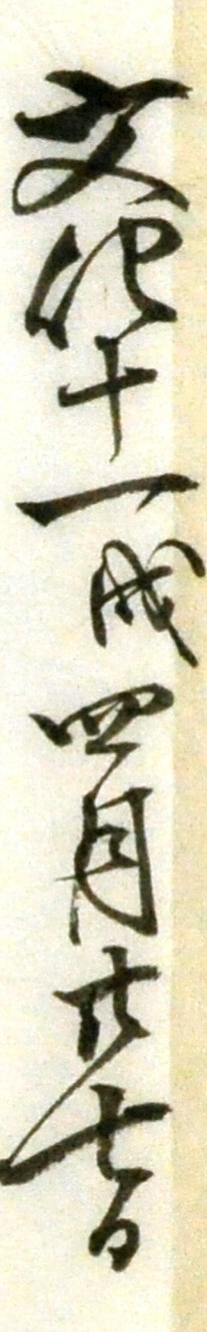文化十一戌四月廿七日
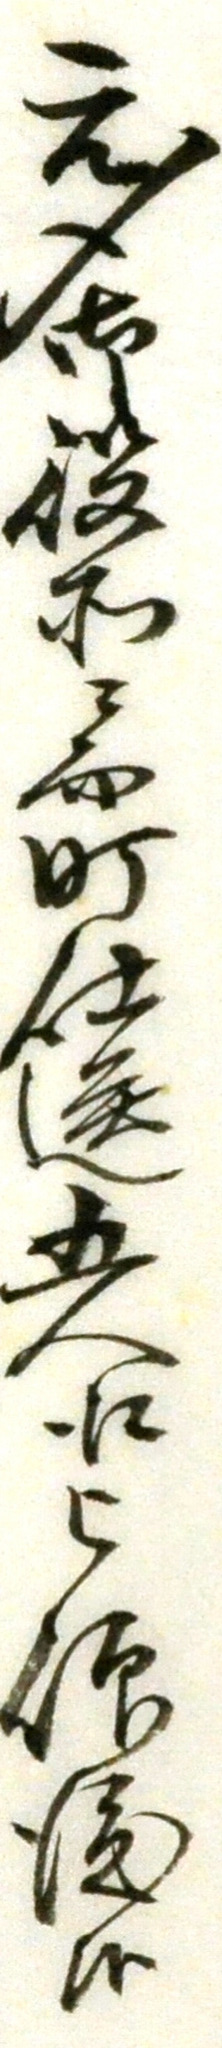元〆御役所ニ而町仕送五人江被仰渡候
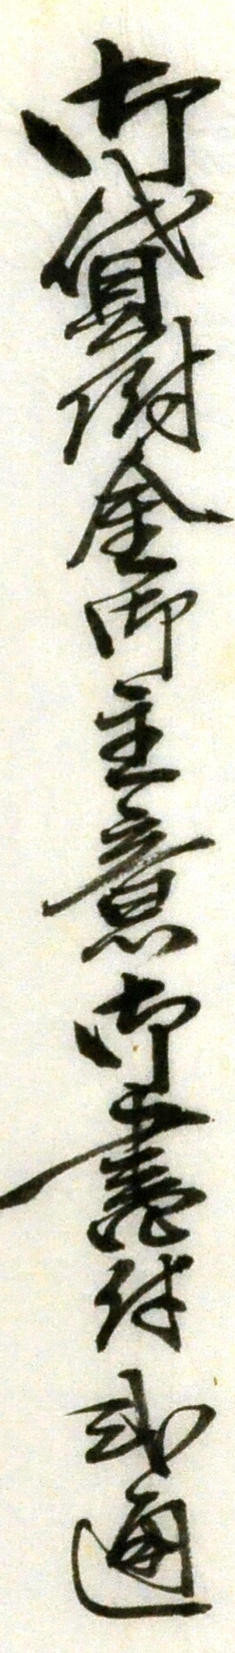御貸付金御主意御書付弐通
